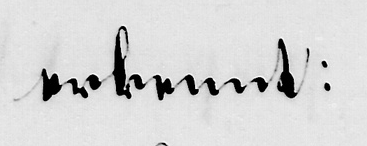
erkennt:
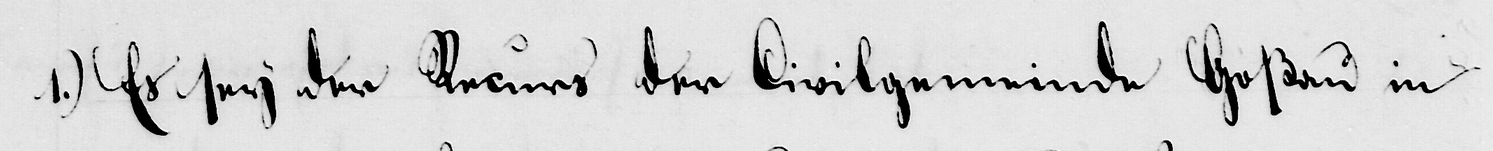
1.) Es sey der Recurs der Civilgemeinde Goßau in
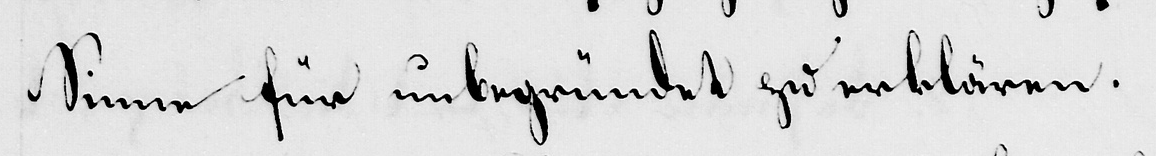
Sinne für unbegründet zu erklären.
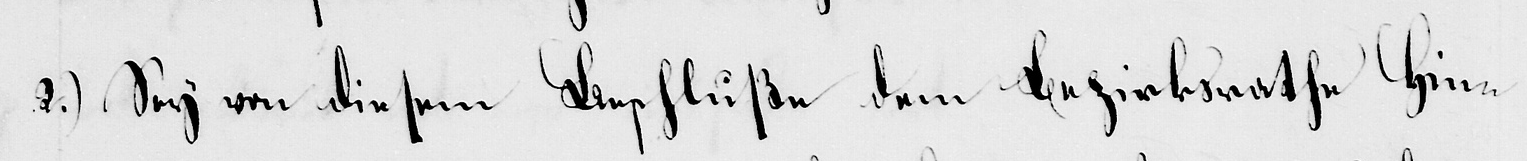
2.) Sey von diesem Beschluße dem Bezirksrathe Hin¬
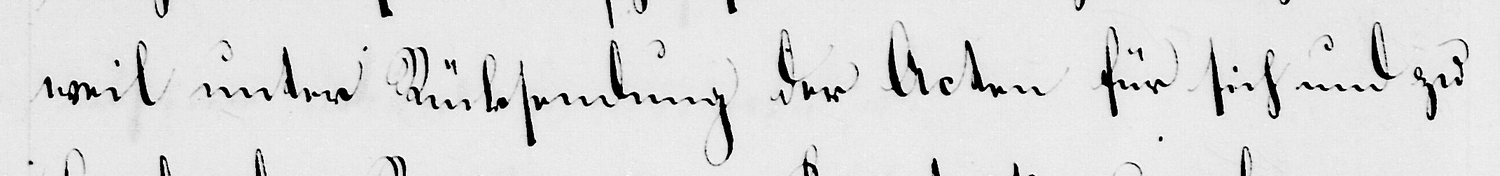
weil unter Rücksendung der Acten für sich und zu
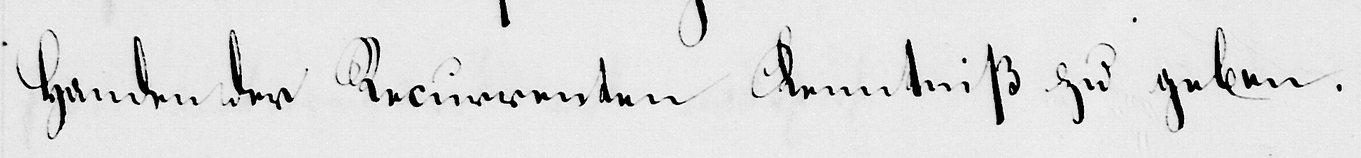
Handen der Recurrenten Kenntniß zu geben.
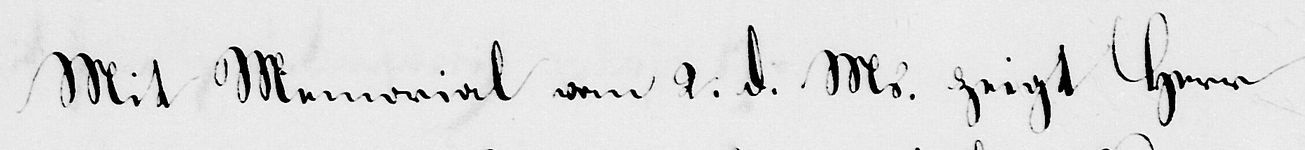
Mit Memorial vom 2. d. Ms. zeigt Herr
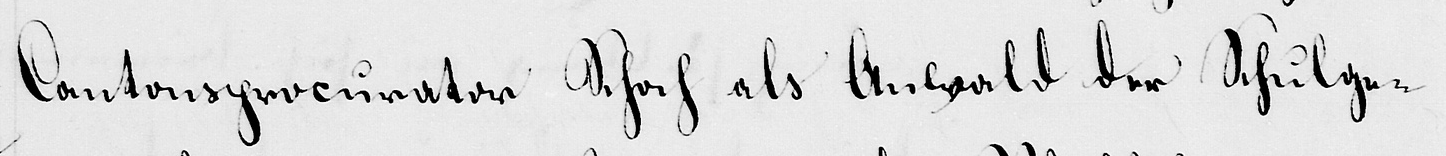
Cantonsprocurator Schoch als Anwald der Schulge¬
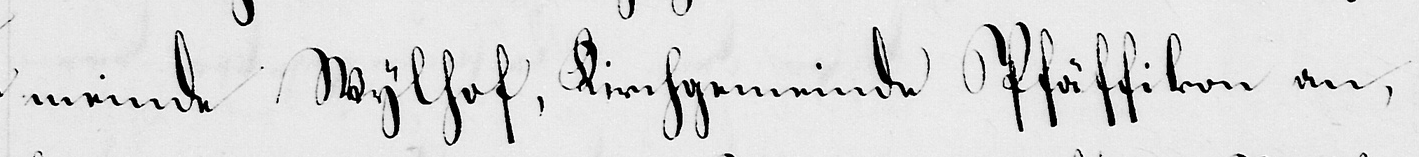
meinde Wylhof, Kirchgemeinde Pfäffikon an,
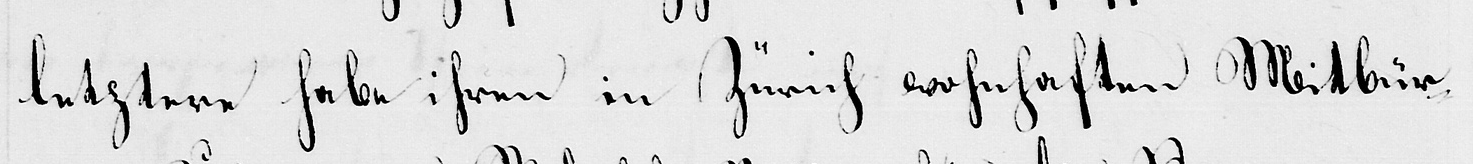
letztere habe ihren in Zürich wohnhaften Mitbür¬
